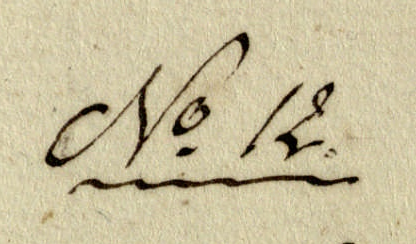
No 12.
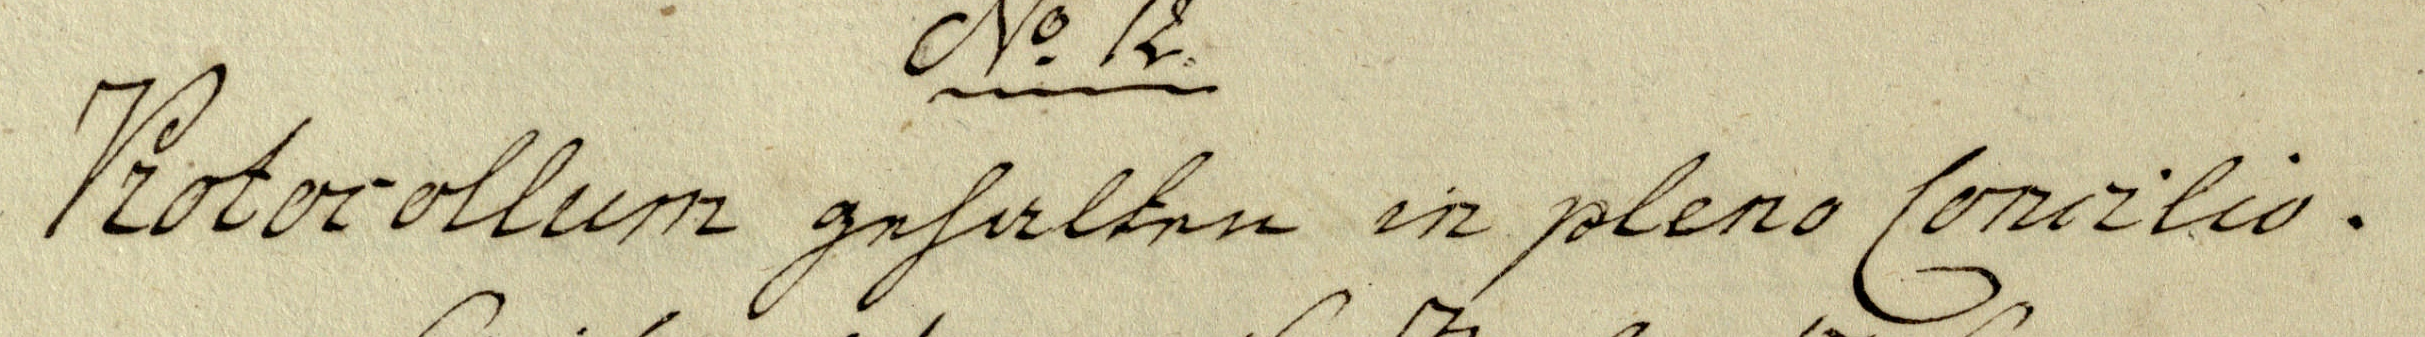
Protocollum gehalten in pleno Concilio.
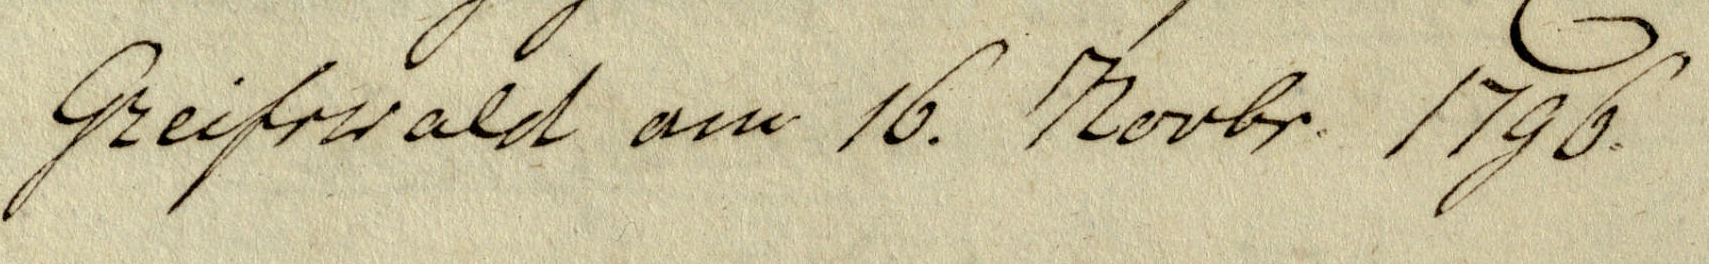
Greifswald am 16. Novbr. 1796.
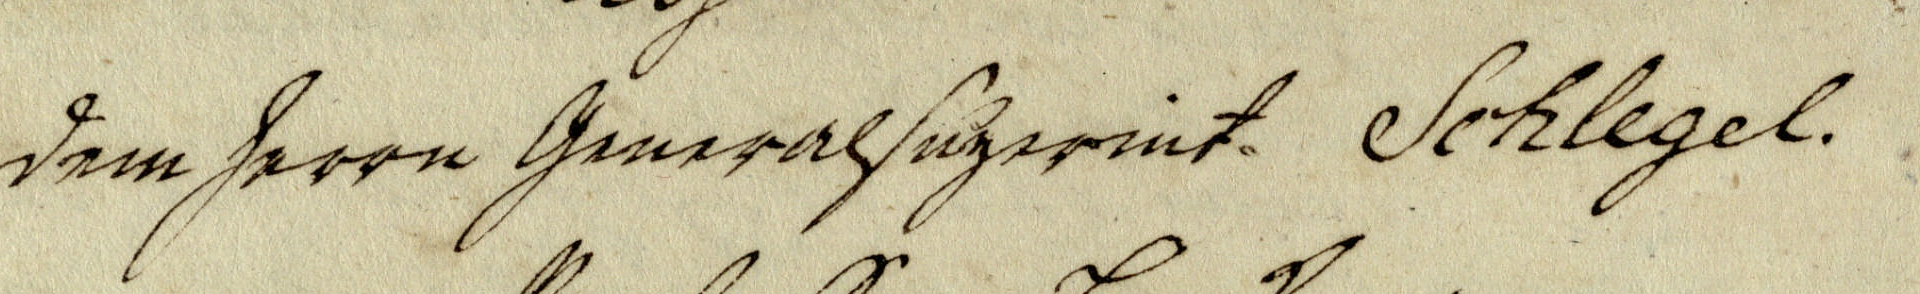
dem Herrn Generalsuperint. Schlegel.
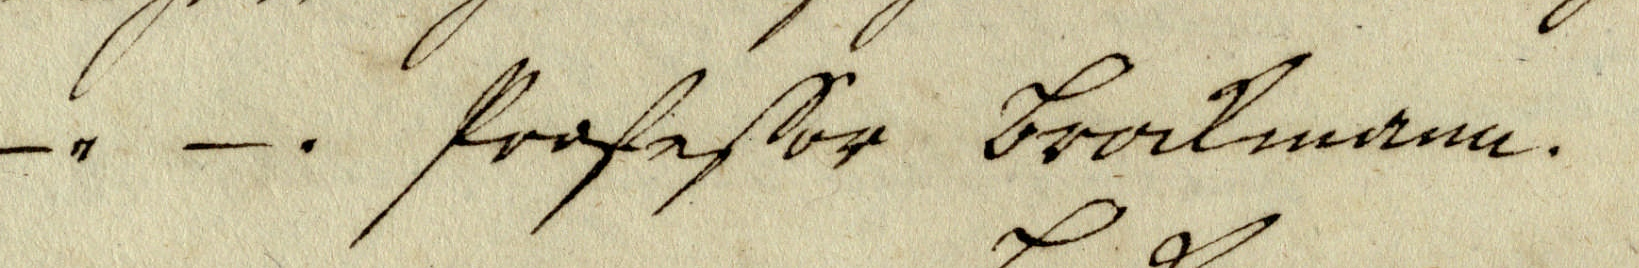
Professor Brockmann.
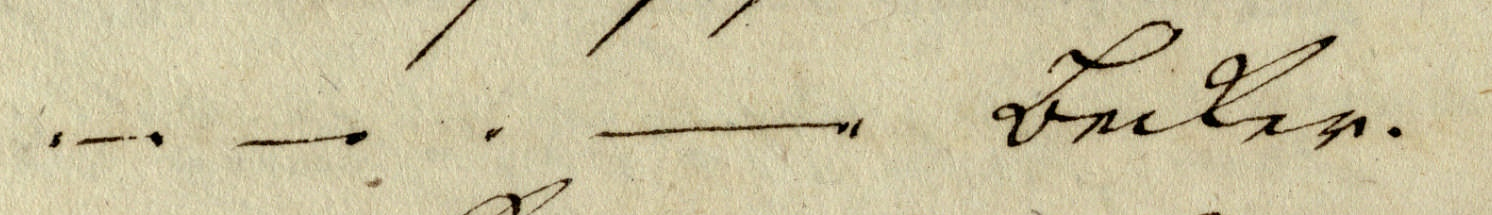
Becker.
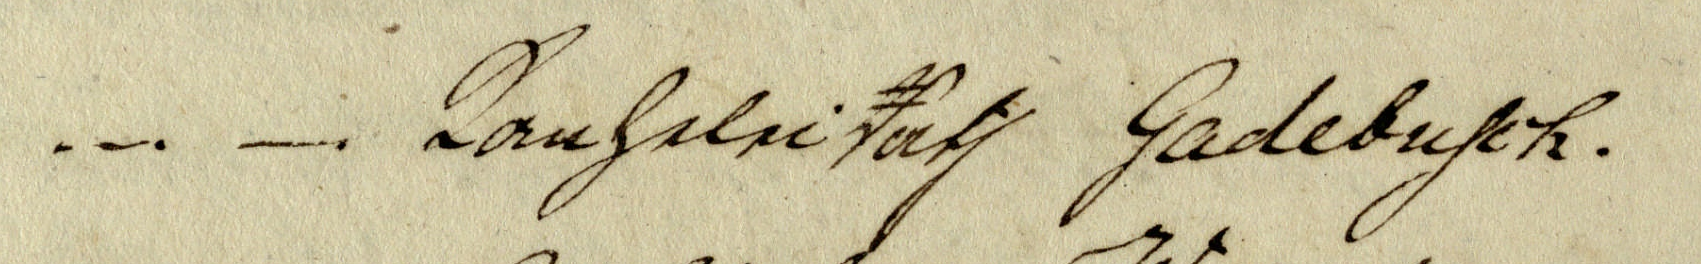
Kanzelei Rath Gadebusch.
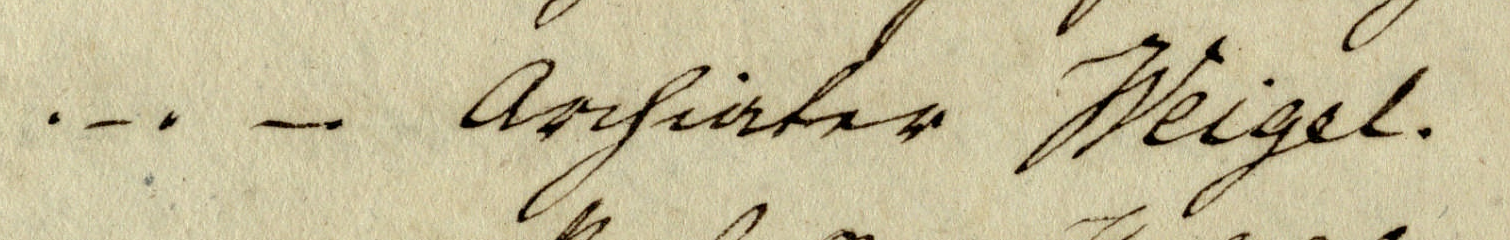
Archiater Weigel.
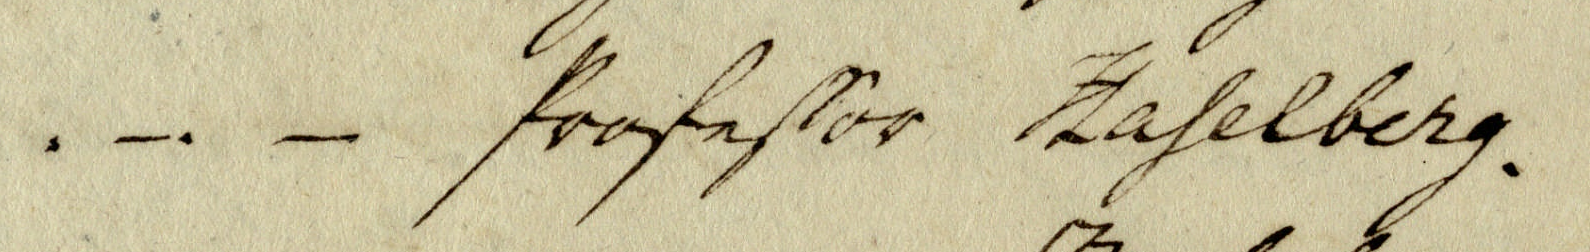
Professor Haselberg.
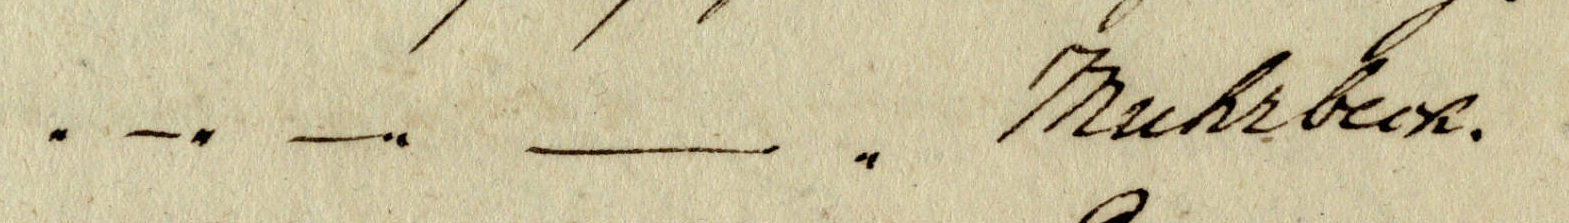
Muhrbeck.
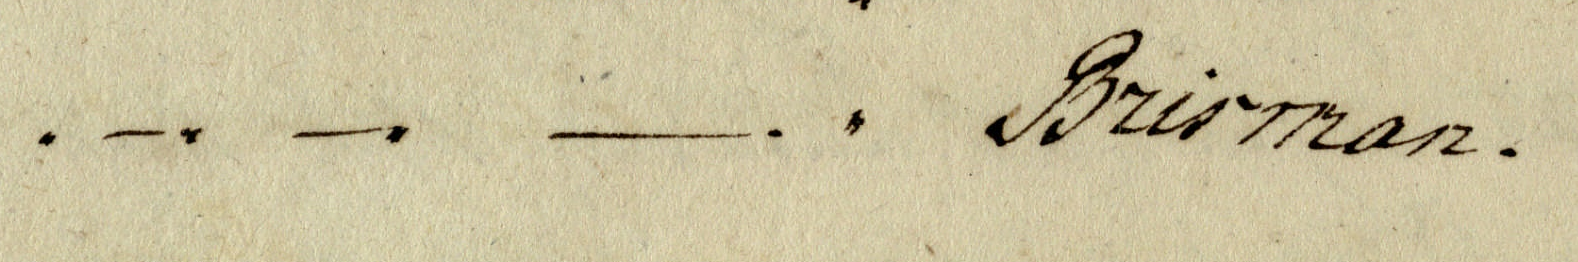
Brisman.
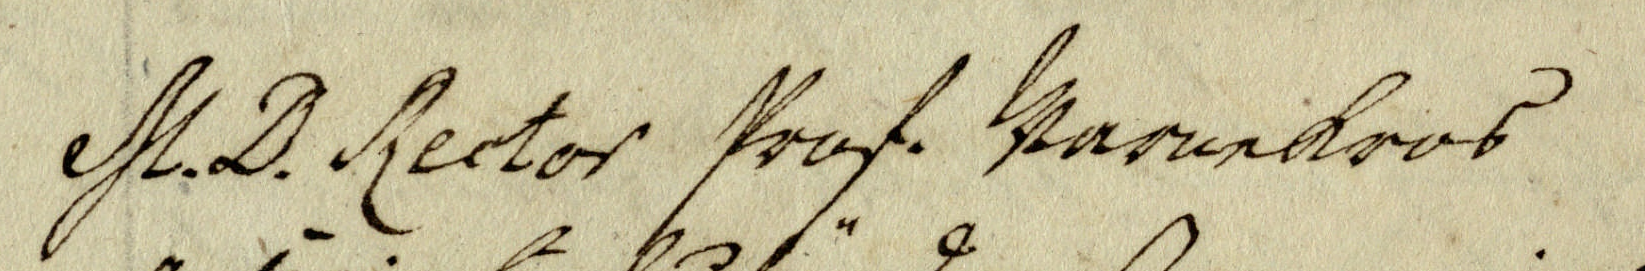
M. D. Rector Prof. Warnekros
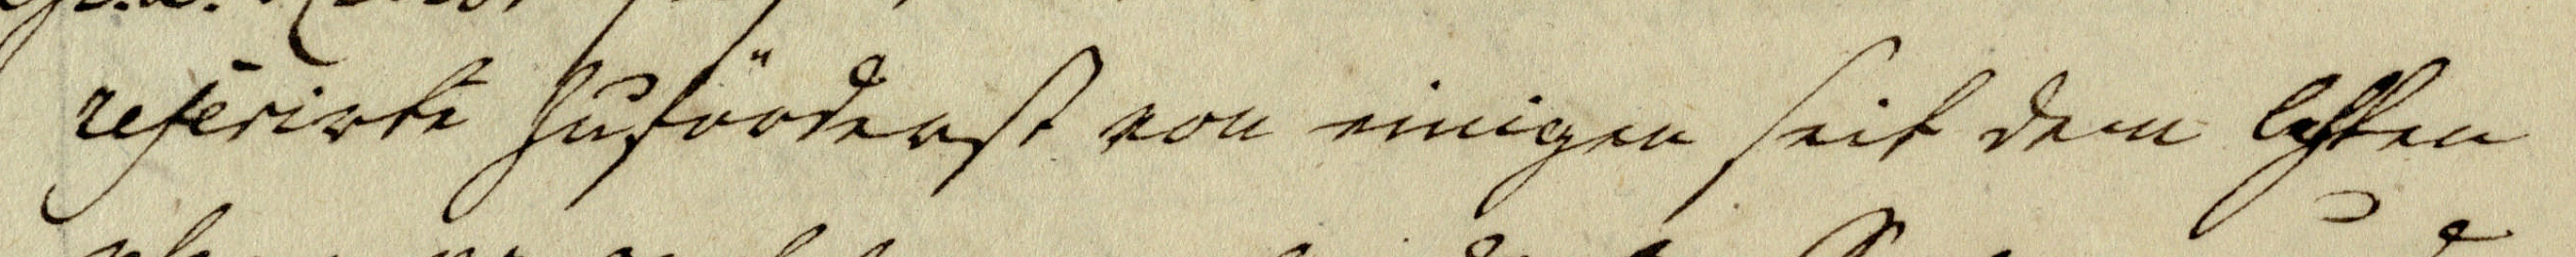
referirte zuförderst von einigen seit dem lezten
